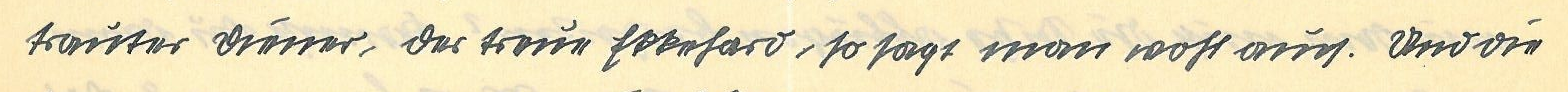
trauter Diener, der treue Ekkehard, so sagt man wohl auch. Und die
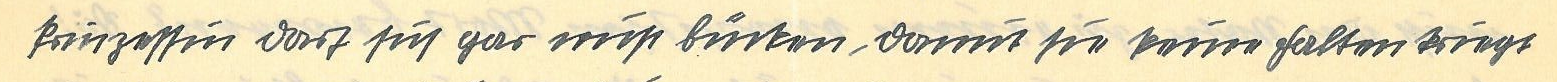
Prinzessin darf sich gar nicht bücken, damit sie keine Falten kriegt
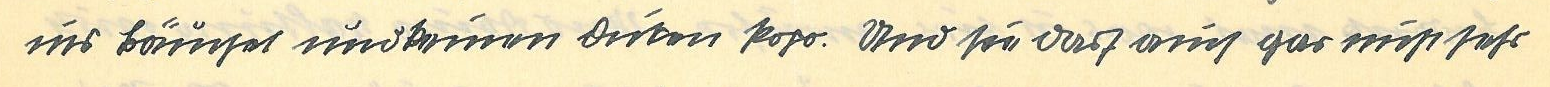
ins Bäuchel und keinen dicken Popo. Und sie darf auch gar nicht sehr
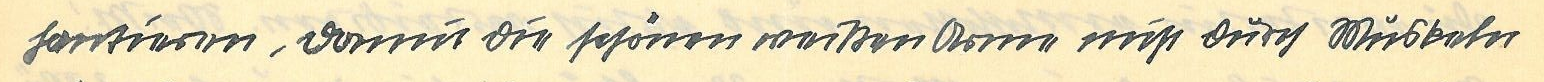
hantieren, damit die schönen weißen Arme nicht durch Muskeln
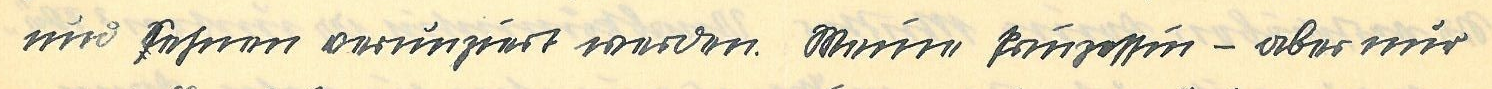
und sSehnen verunziert werden. Meine Prinzessin – aber nur
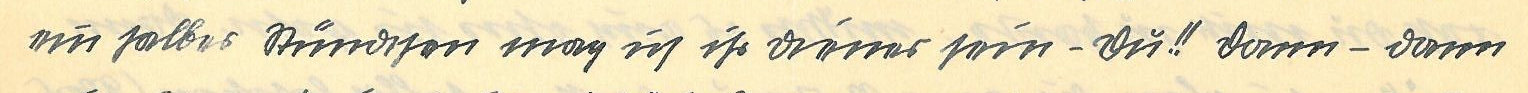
ein halbes Stündchen mag ich ihr Diener sein – Du!! Dann – dann
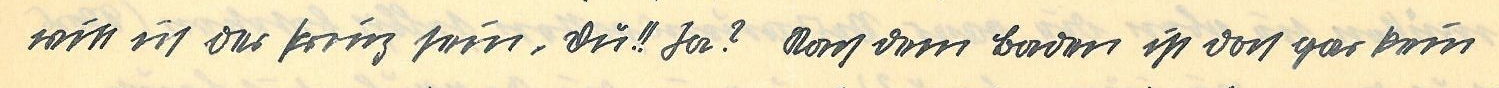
will ich der Prinz sein, Du!! Ja? Nach dem Baden ist doch gar kein
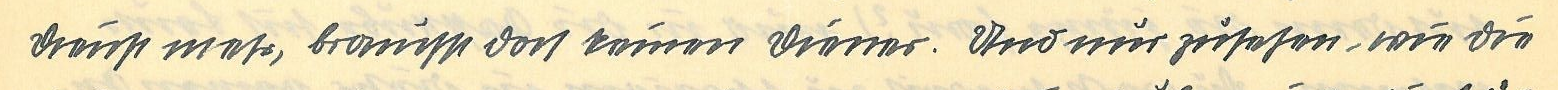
Dienst mehr, brauchst doch keinen Diener. Und nur zusehen, wie die
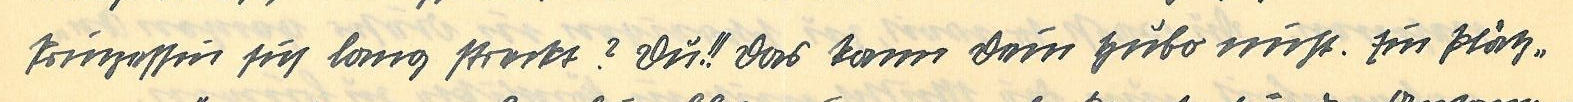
Prinzessin sich lang streckt? Du!! Das kann Dein Hubo nicht. Ein Plätz¬
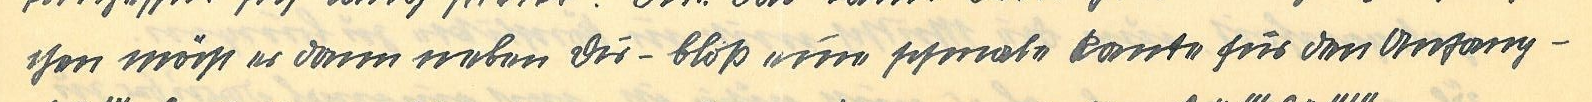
chen möchte er dann neben Dir – bloß eine schmale Kante für den Anfang –
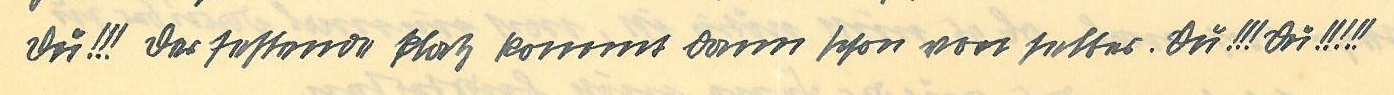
Du!!! Der fehlende Platz kommt dann schon von selber. Du!!! Du!!!!!
